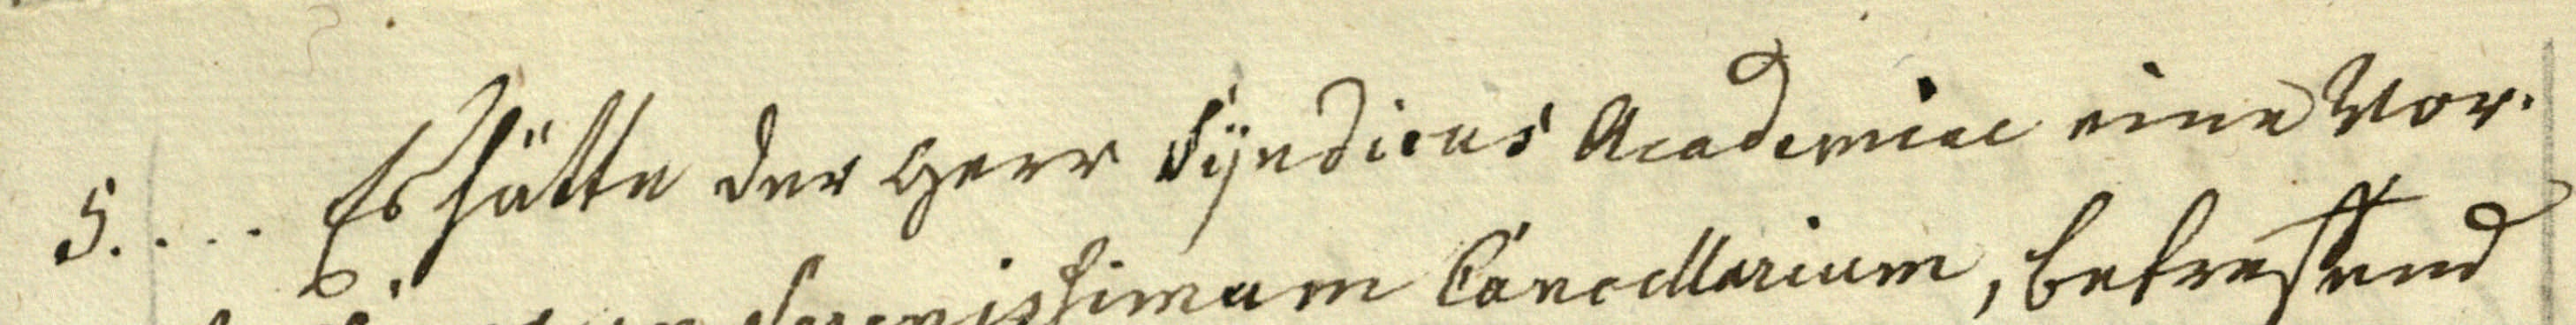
5. Es hätte der Herr Sÿndicus Academiae eine Vor¬
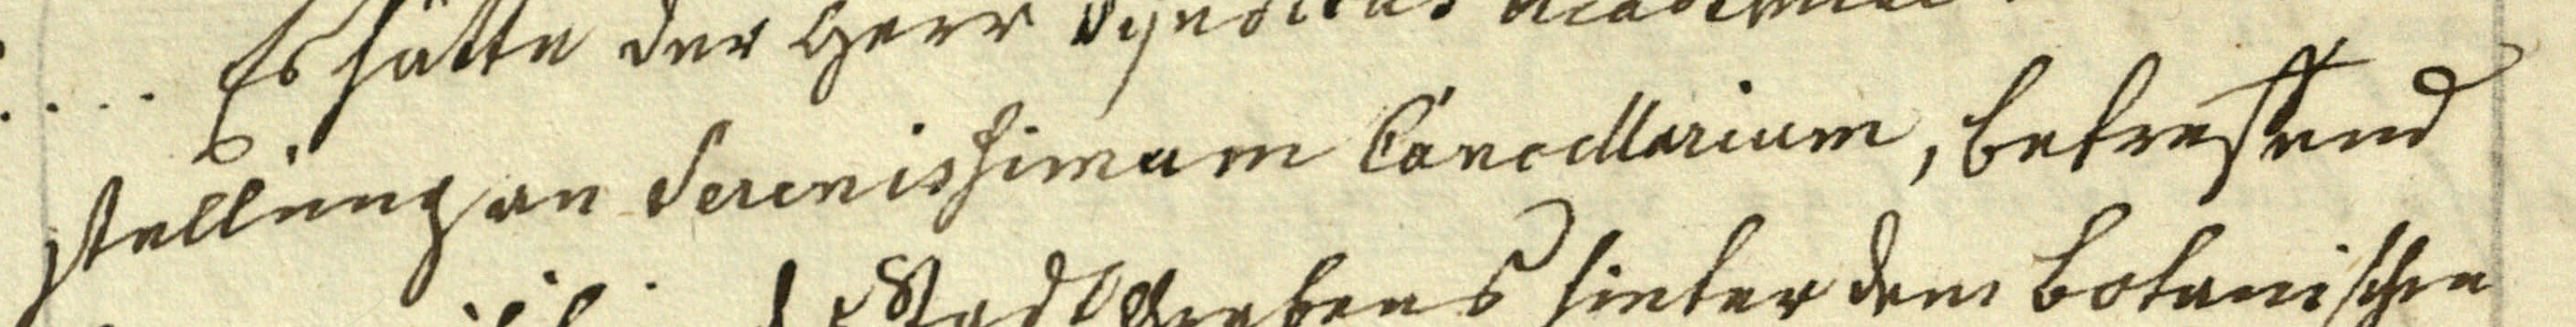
stellung an Serenissimum Cancellarium, betreffend
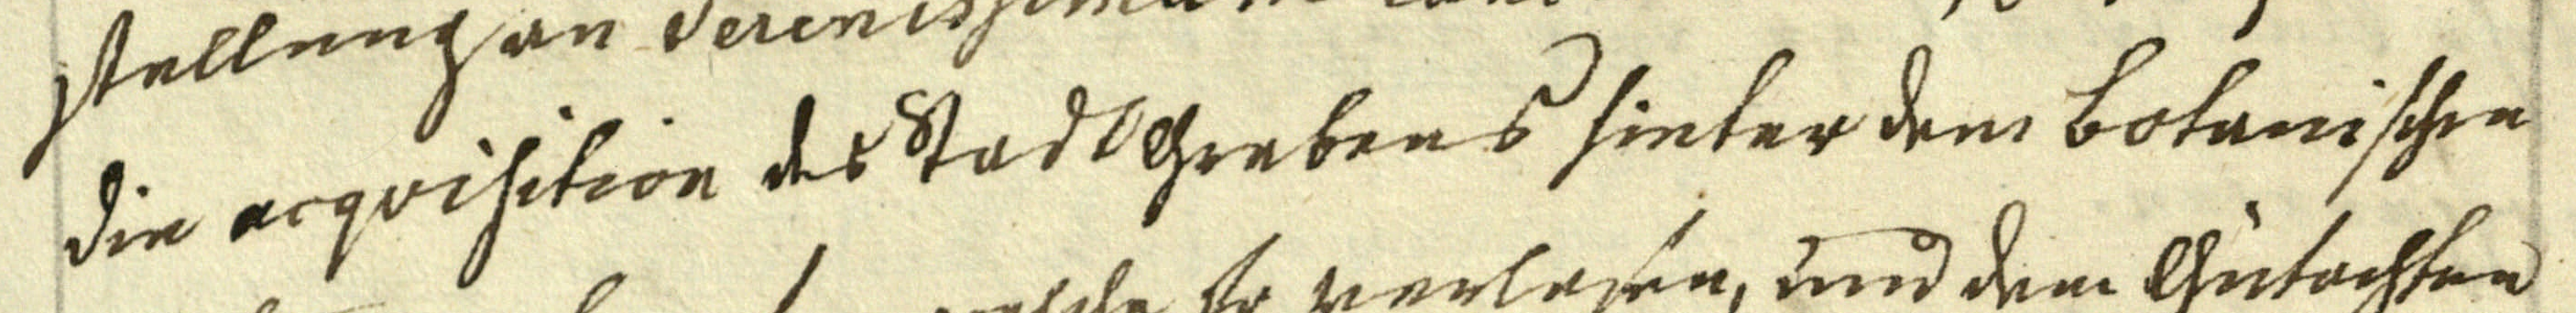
die aquisition des StadtGrabens hinter dem Botanischen
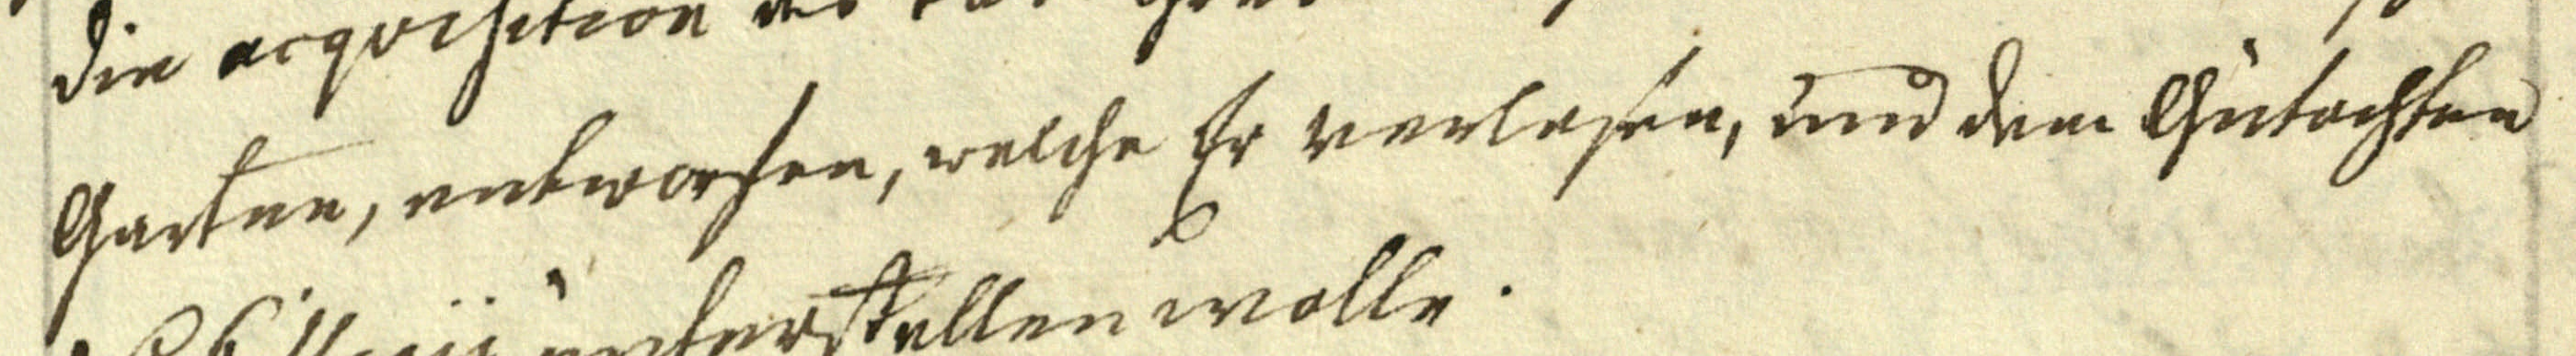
Garten, entworfen, welche Er verlesen, und dem Gutachten
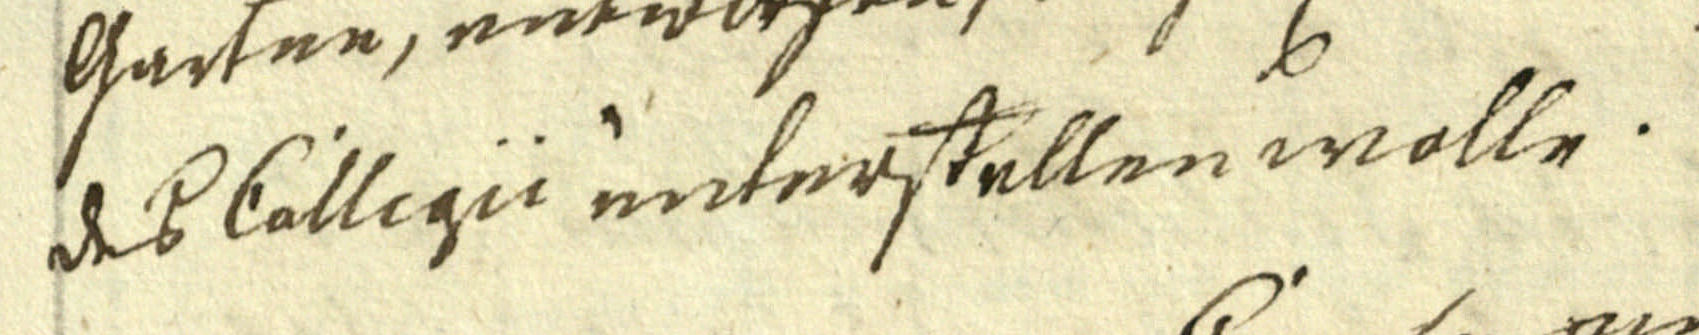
des Collegii unterstellen wolle.
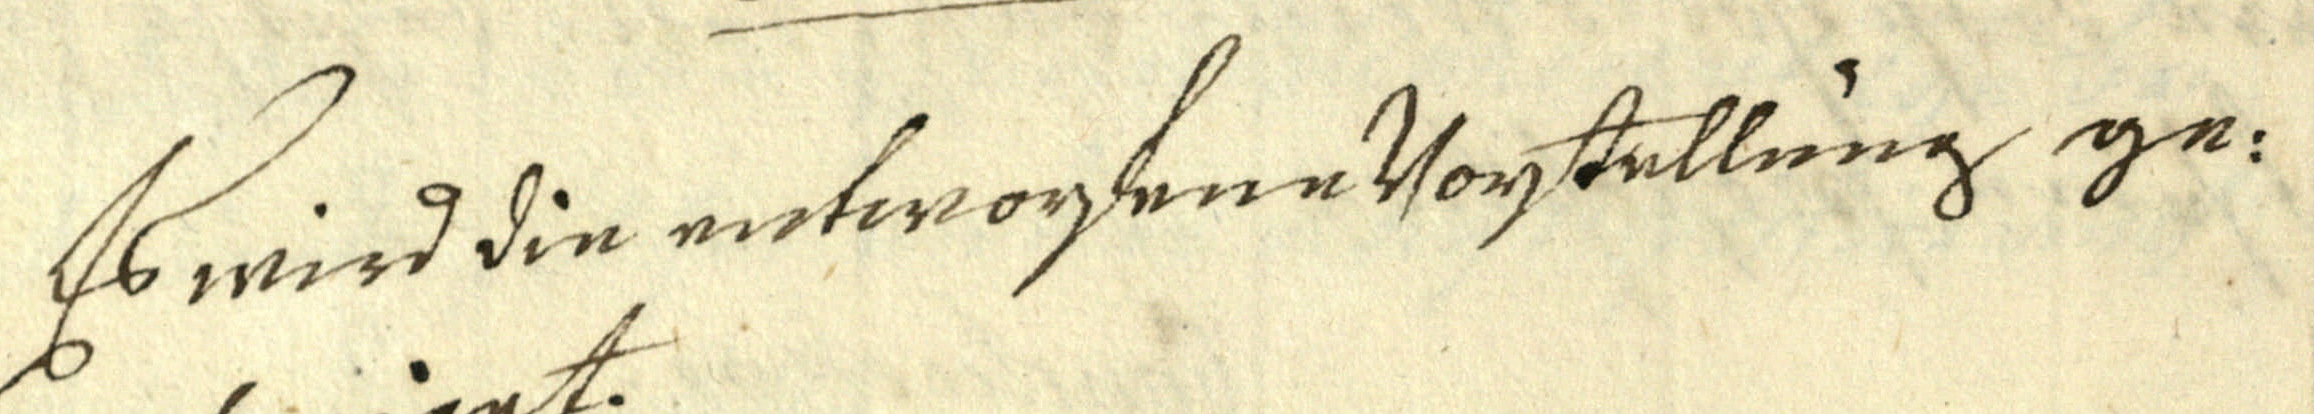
Es wird die entworfene Vorstellung ge¬
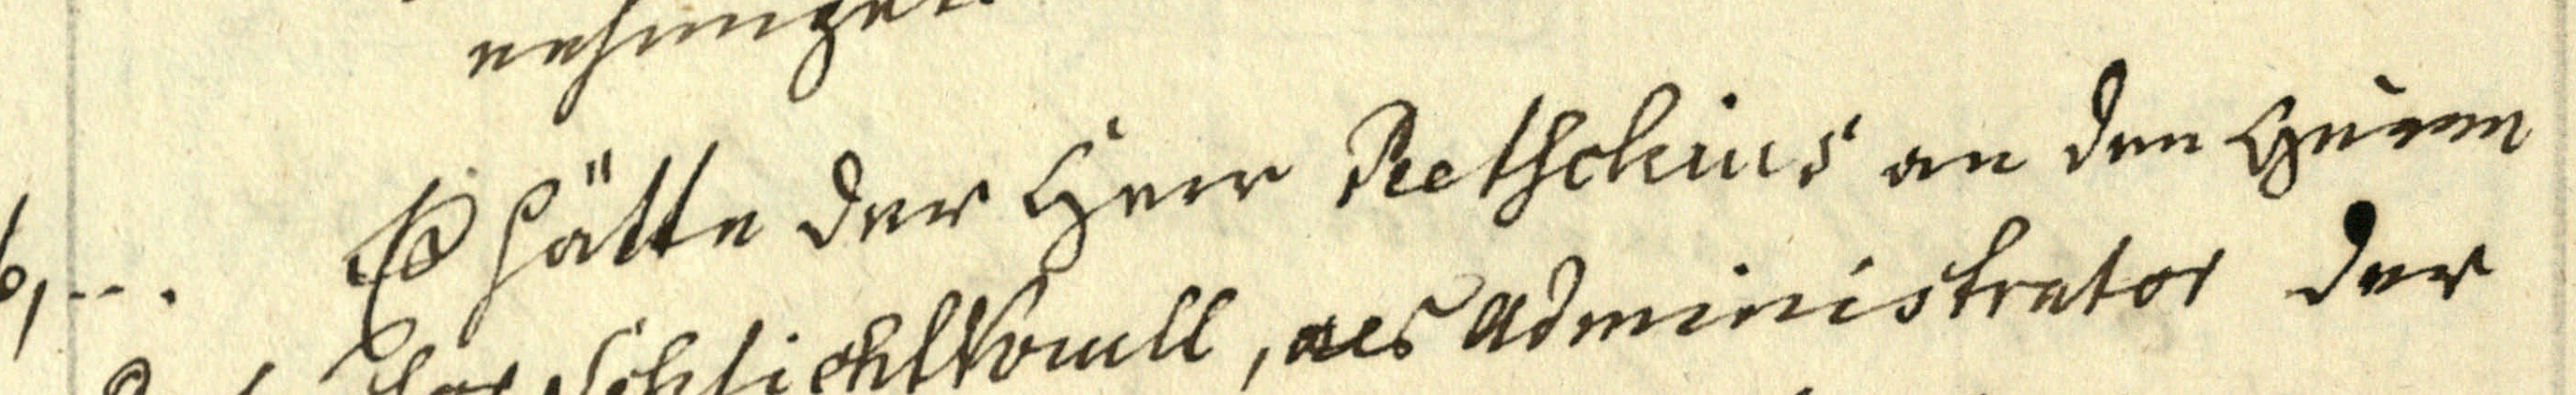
6, Es hätte der Herr Retschius an dem Herrn
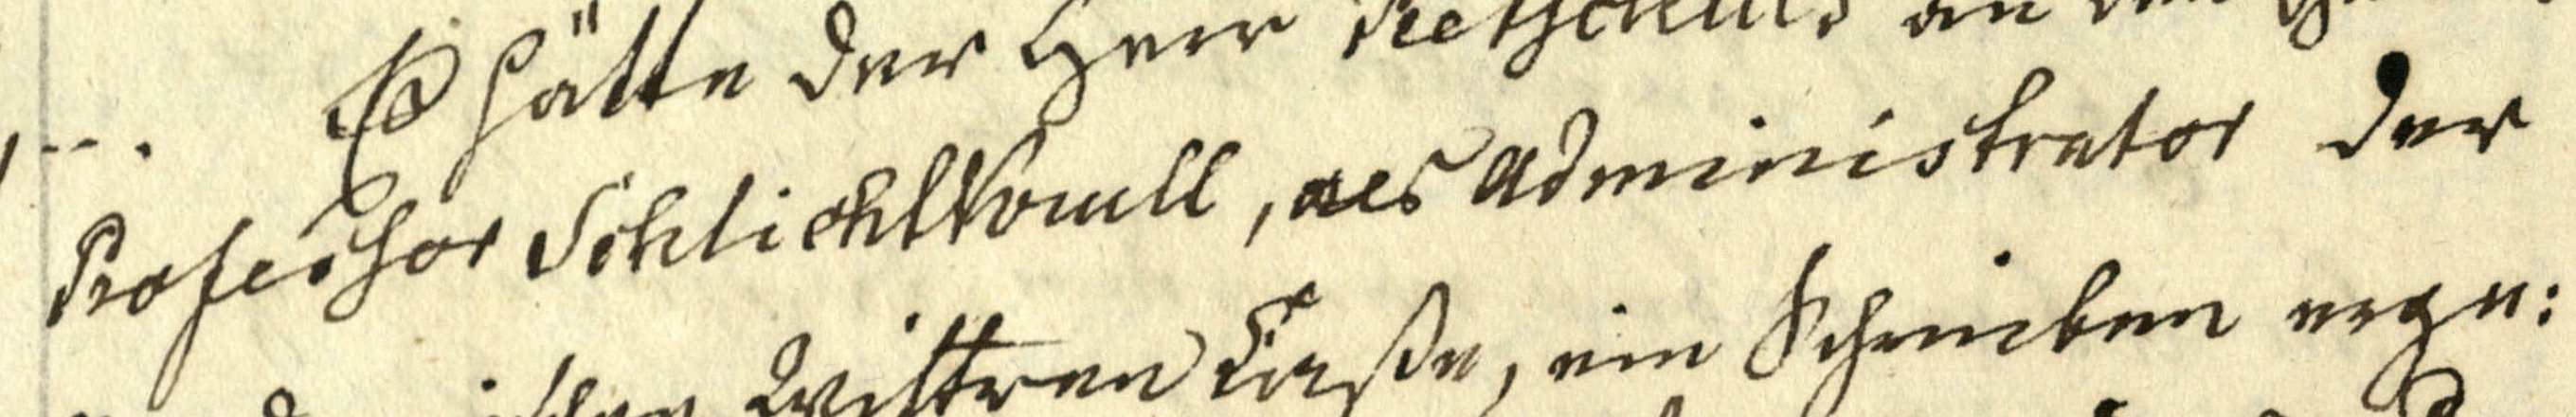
Professor Schlichtkrull, als Administrator der
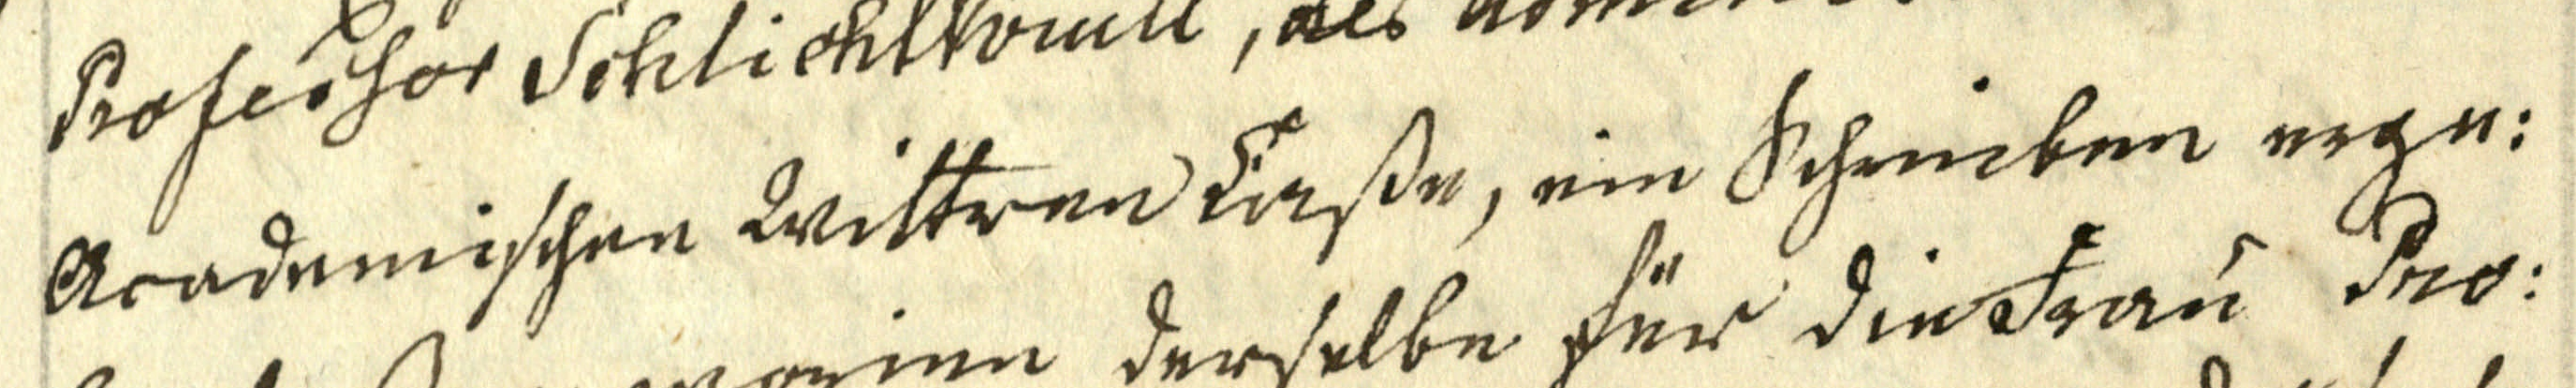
Academischen Wittwen Caße, ein Schreiben erge¬
